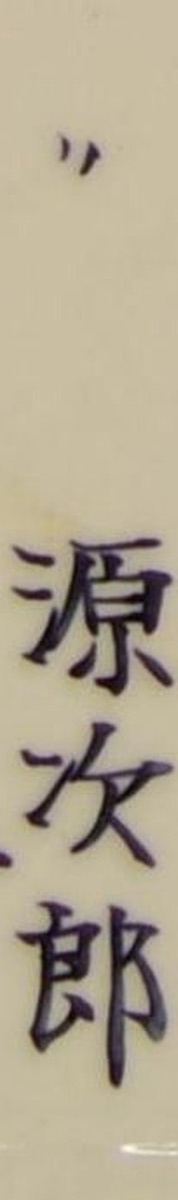源次郎
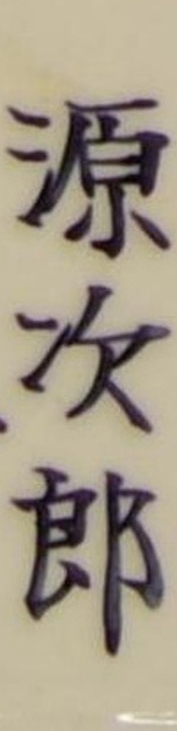源次郎
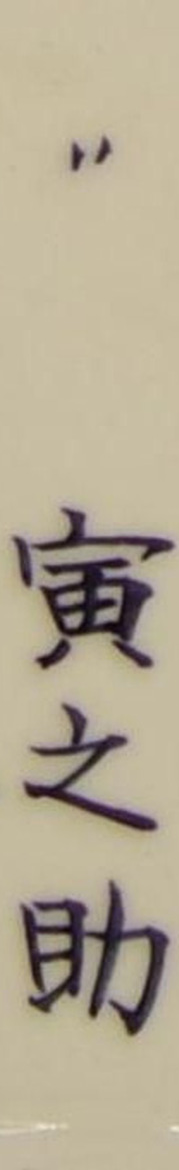寅之助
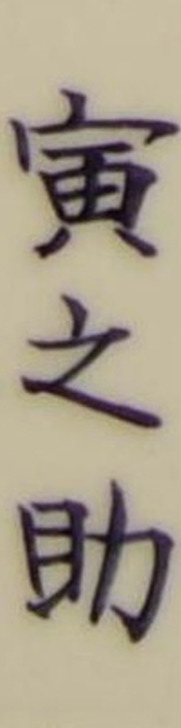寅之助
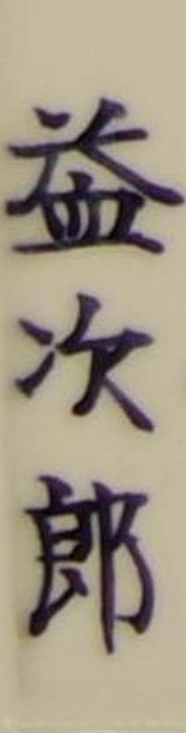益次郎

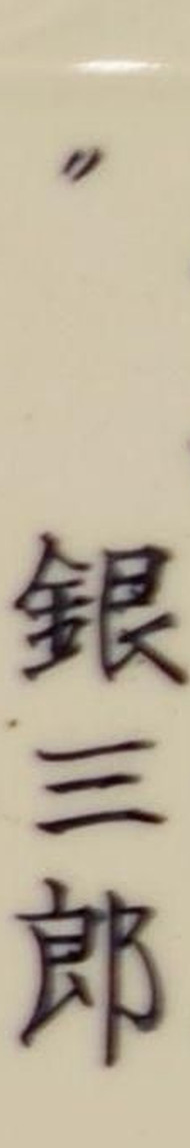銀三郎
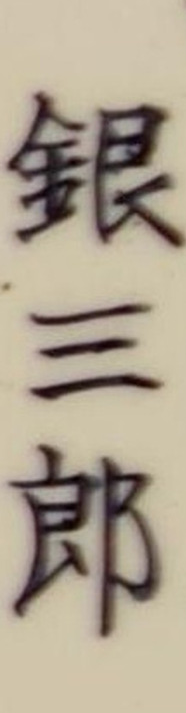銀三郎
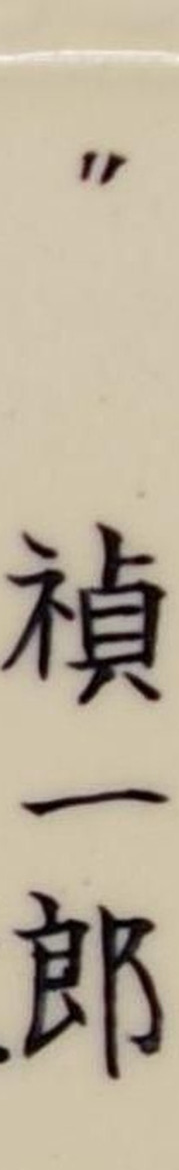禎一郎
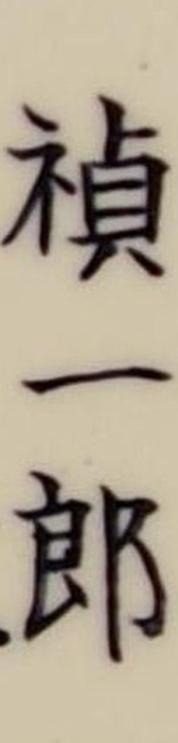禎一郎
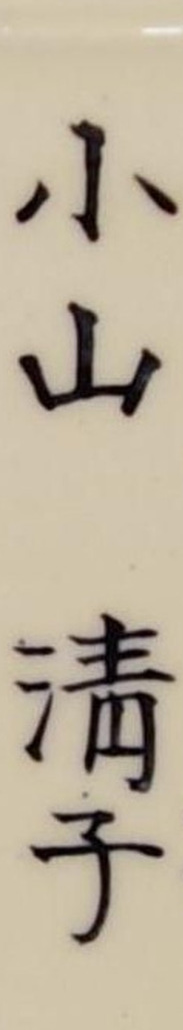小山清子
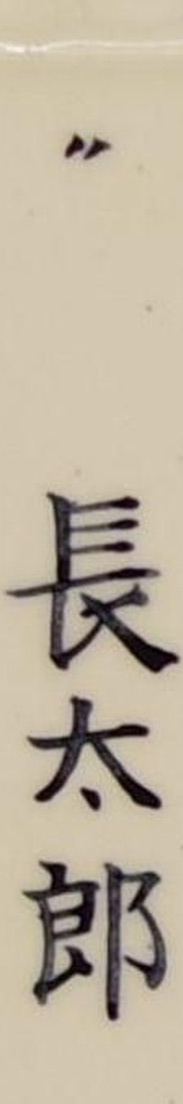長太郎
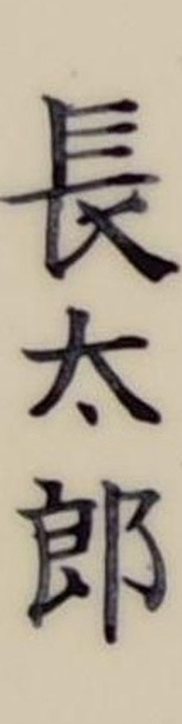長太郎
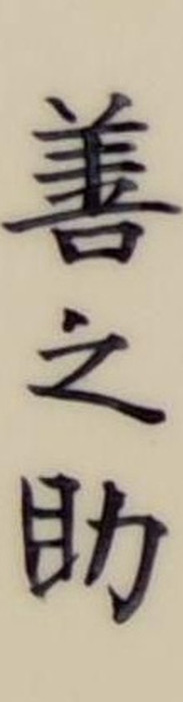善之助
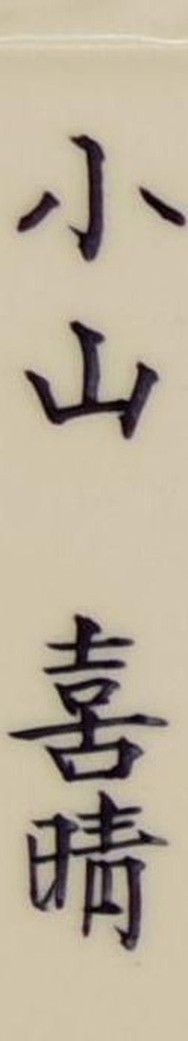小山喜晴
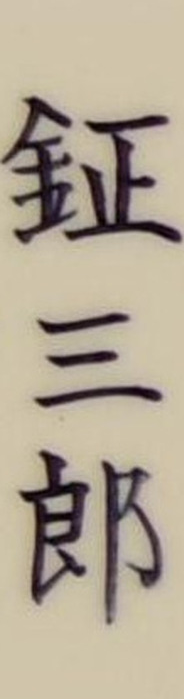鉦三郎
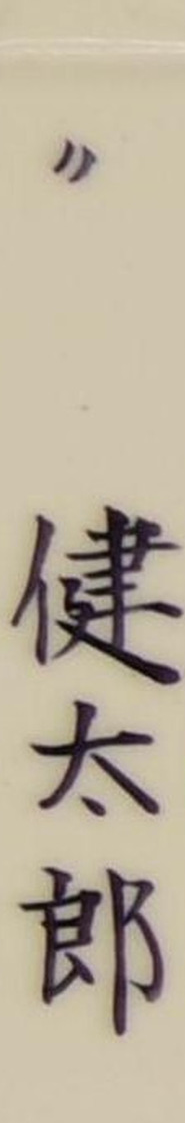健太郎
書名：E~L
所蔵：高野山金剛峯寺
